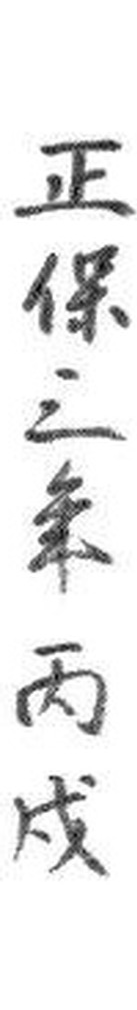正保三年丙戌
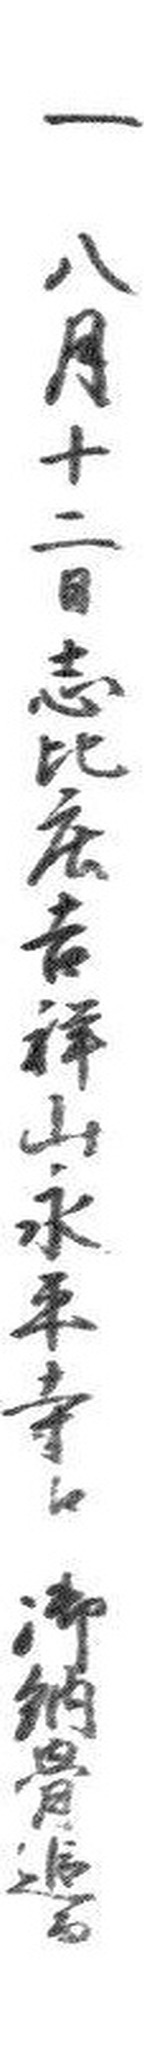一八月十二日志比庄吉祥山永平寺江御納骨追而
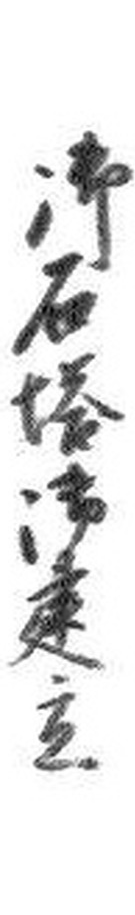御石塔御建立

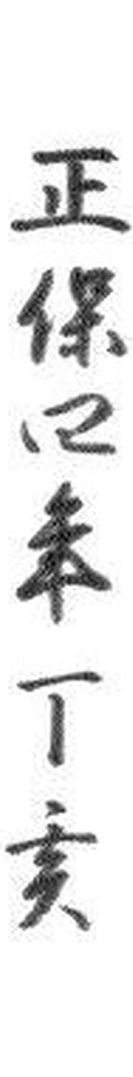正保四年丁亥
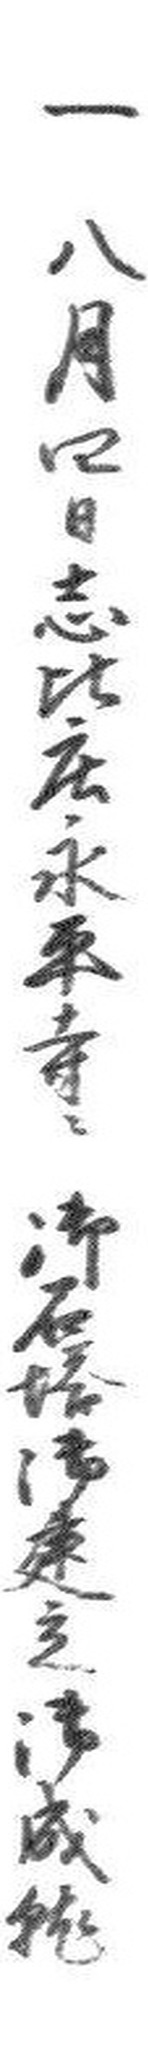一八月四日志比庄永平寺ニ御石塔御建立御成就
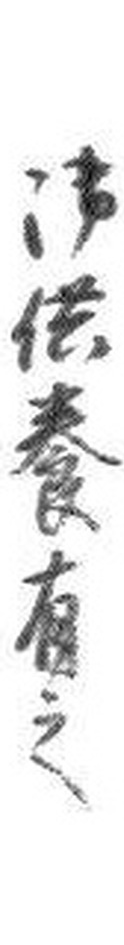御供養有之
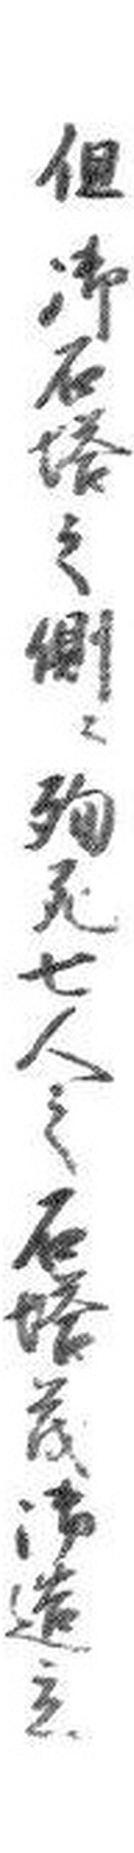但御石塔之側ニ殉死七人之石塔茂御造立
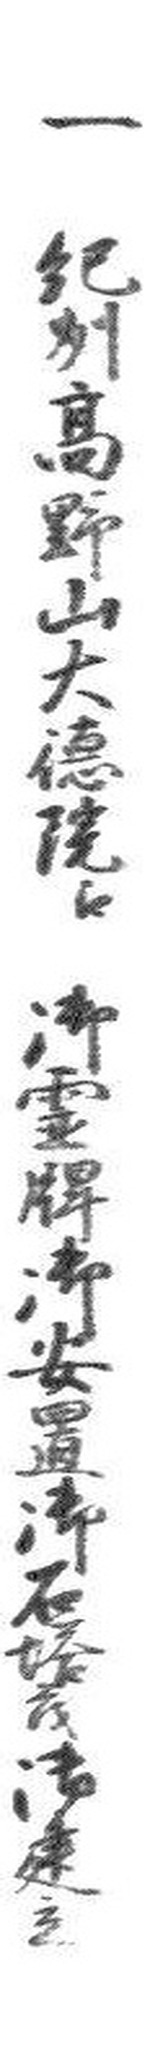一紀州高野山大徳院江御霊牌御安置御石塔茂御建立
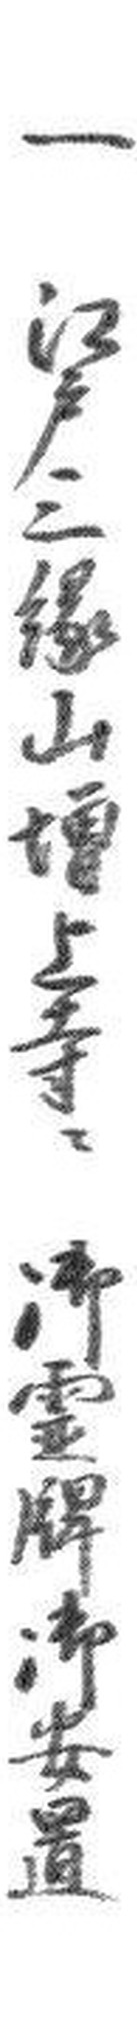一江戸三縁山増上寺ニ御霊牌御安置

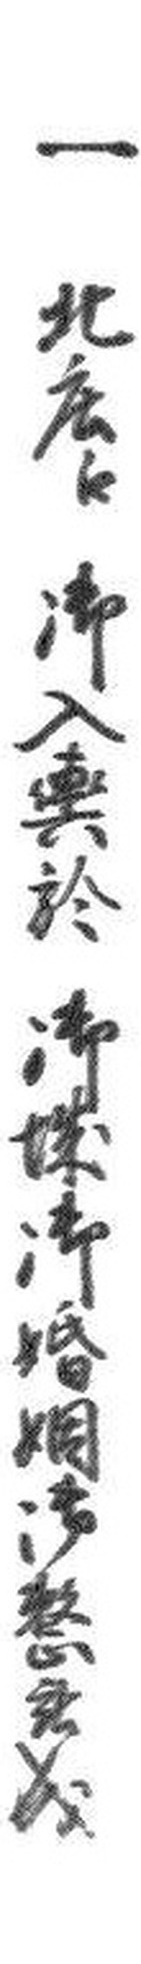一北庄江御入輿於御城御婚姻御整被成
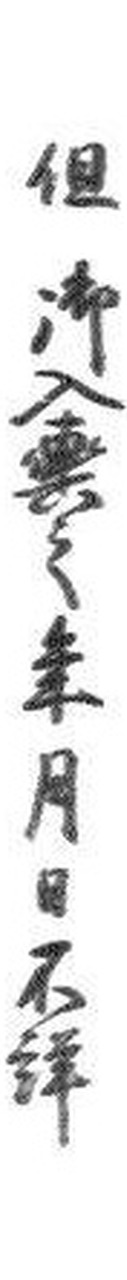但御入輿之年月日不詳
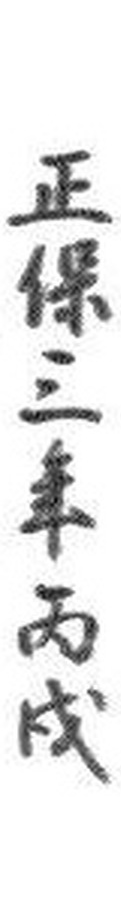正保三年丙戌
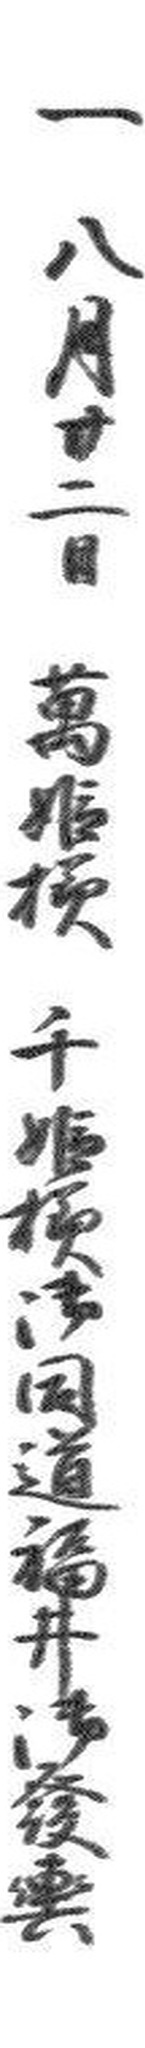一八月廿二日万姫様千姫様御同道福井御発輿
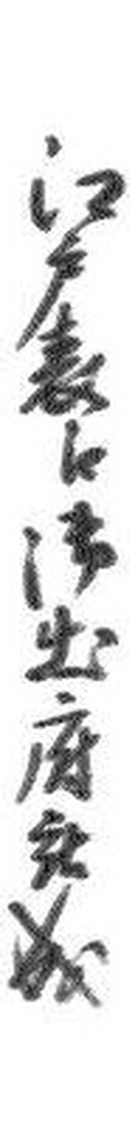江戸表江御出府被成

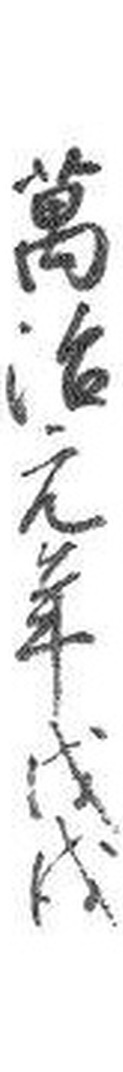万治元年戊戌
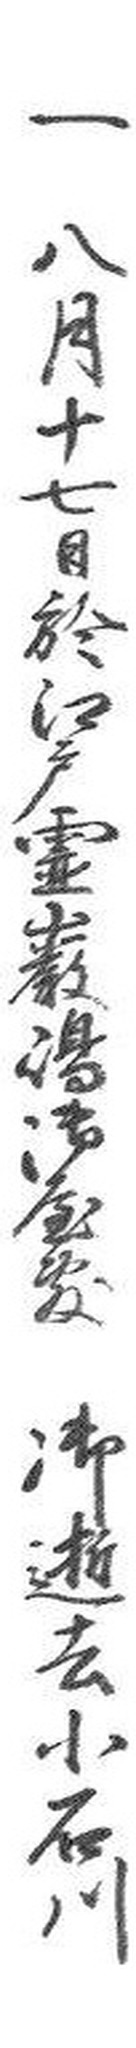一八月十七日於江戸霊巌島御屋敷御逝去小石川
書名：家譜 四 忠昌公 従寛永七年到正保四年
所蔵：福井県文書館 Fukui Prefectural Archives
